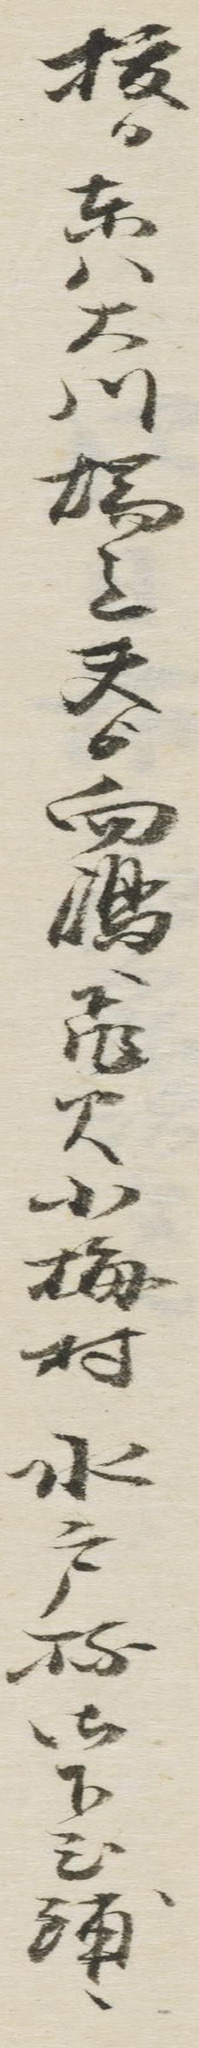抜け東ハ大川端迄夫ゟ向嶋へ飛火小梅村水戸様御下屋鋪へ
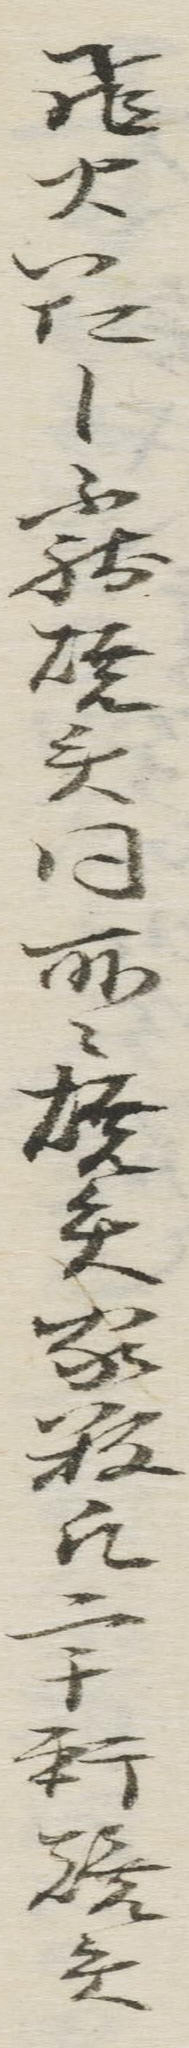飛火いたし不残焼失同所ニ焼失家数凡二千軒焼失
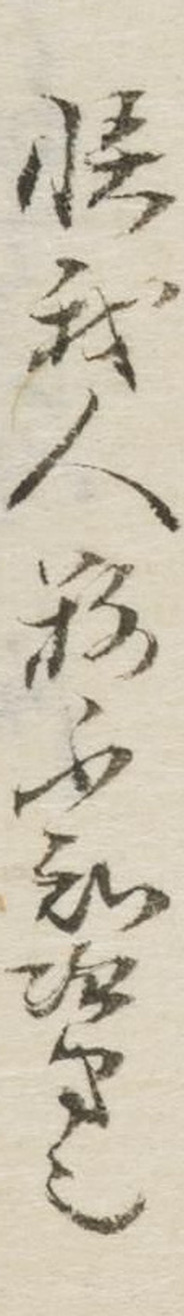怪我人数不知次第也
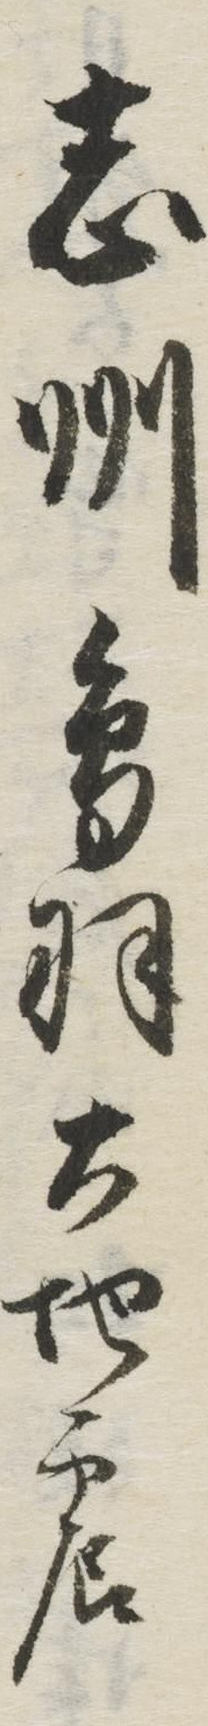志州鳥羽大地震
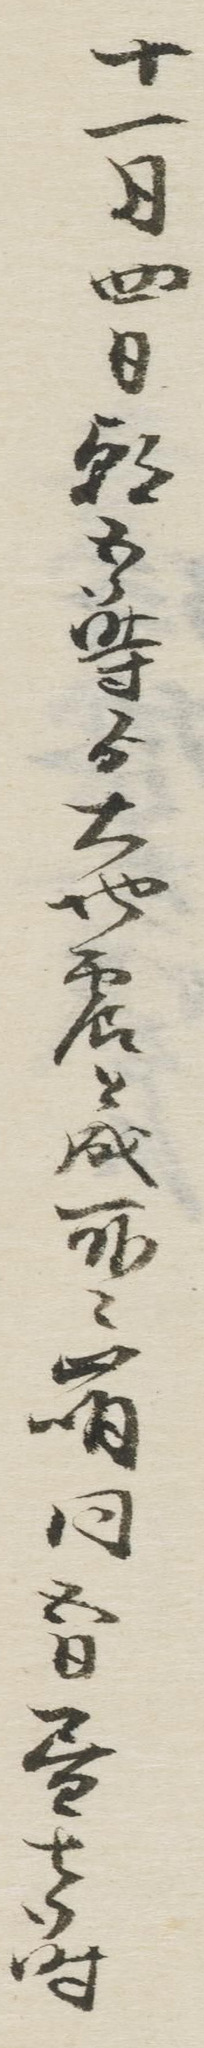十一月四日朝五ッ時ゟ大地震と成所々崩同五日昼七ッ時
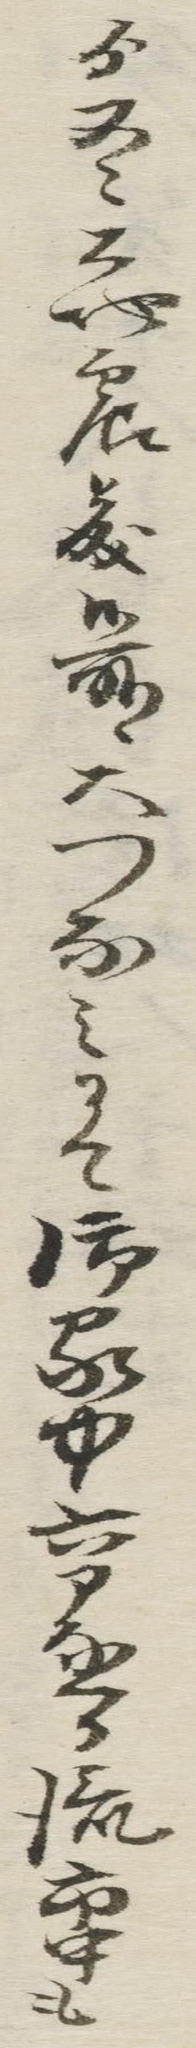ゟ又々大地震と成候処大つなミにて御家中六部通り流市中
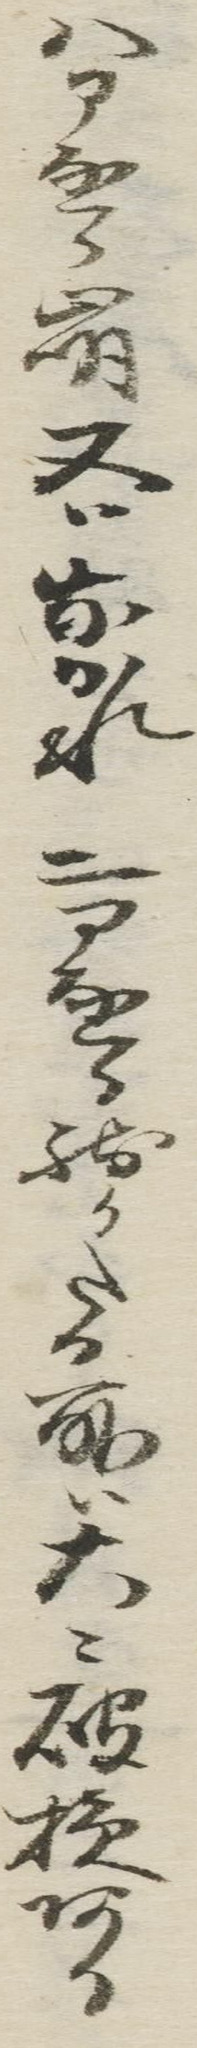八部通り崩又ハ家かれ二部通り残りたる所ハ大二破損あり

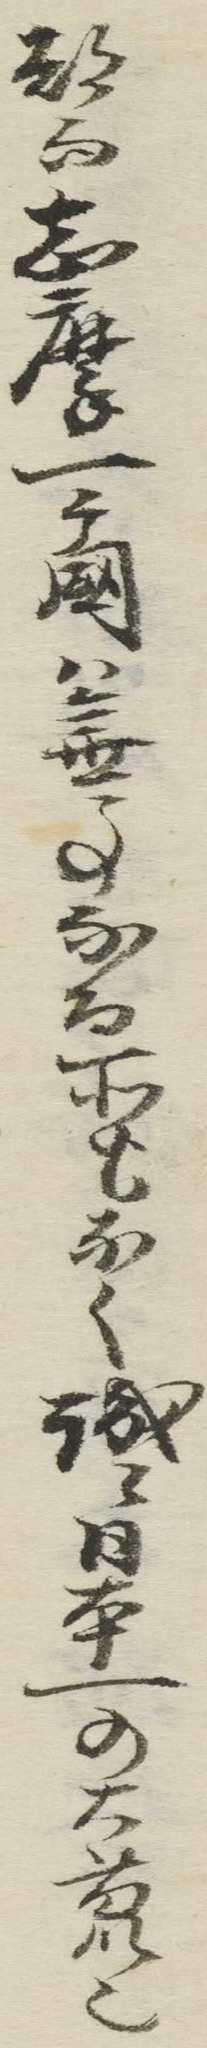都而志摩一ケ国は無事なる所もなく誠に日本一の大荒也
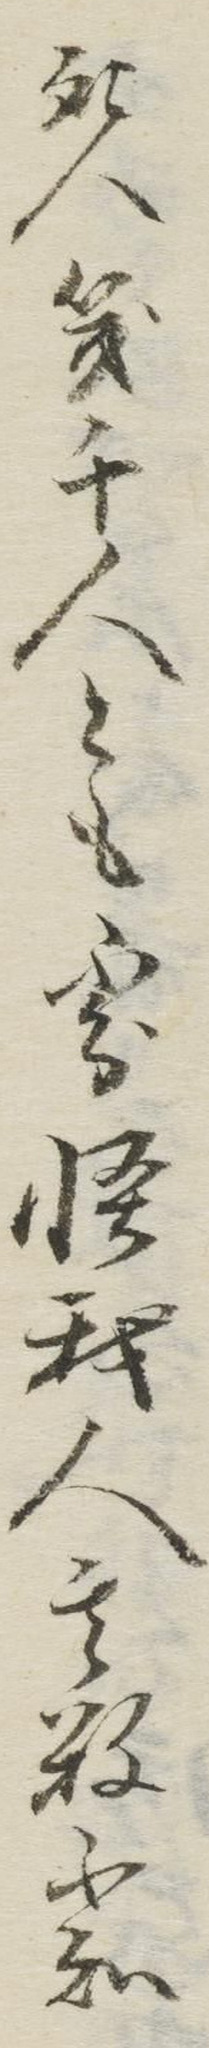死人幾千人とも不分怪我人其数不知
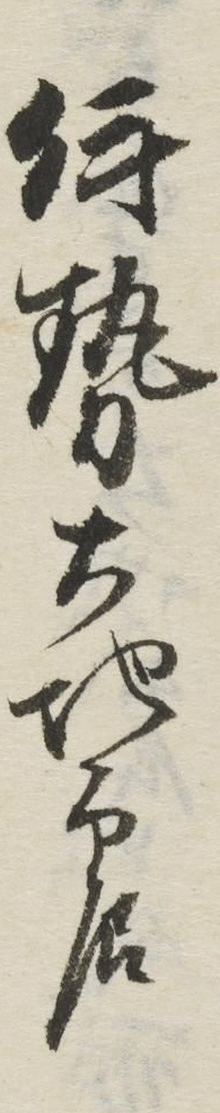伊勢大地震
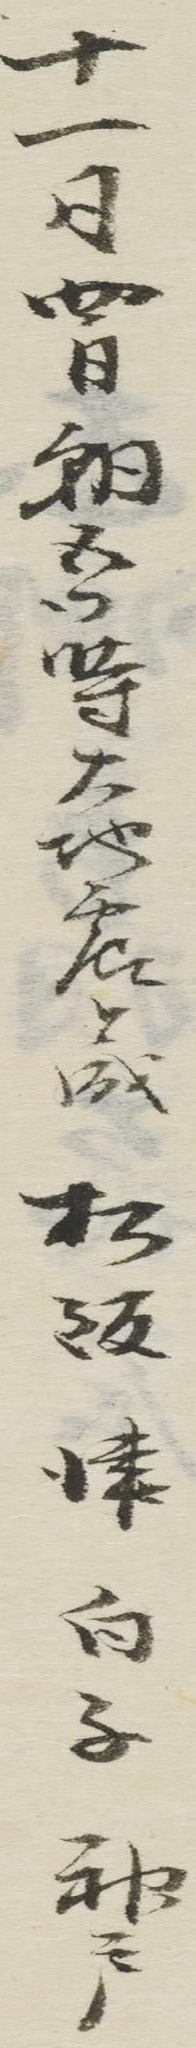十一月四日朝五ッ時大地震と成松阪津白子神戸
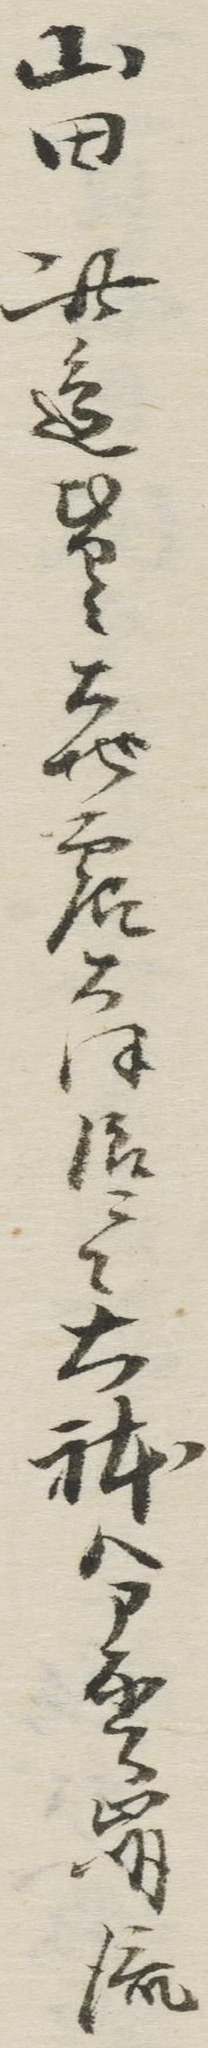山田此辺皆々大地震大津浪ニて大体八部通り崩流
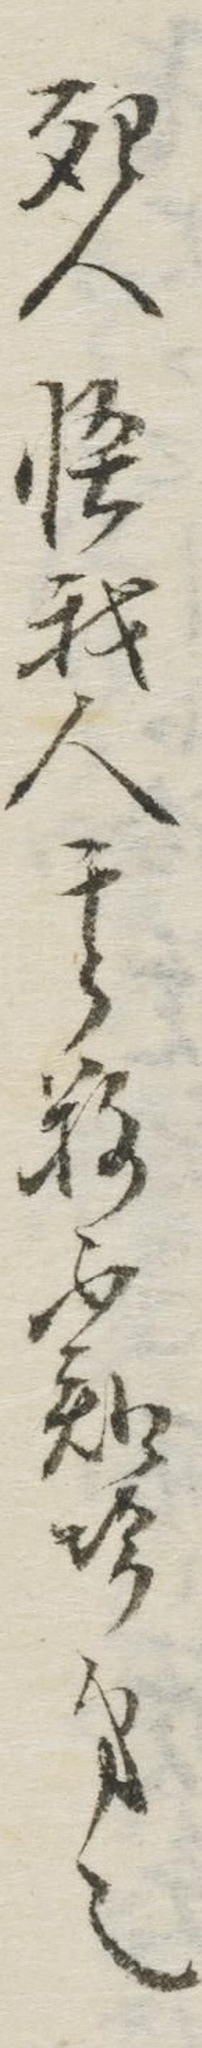死人怪我人其数不知次第也
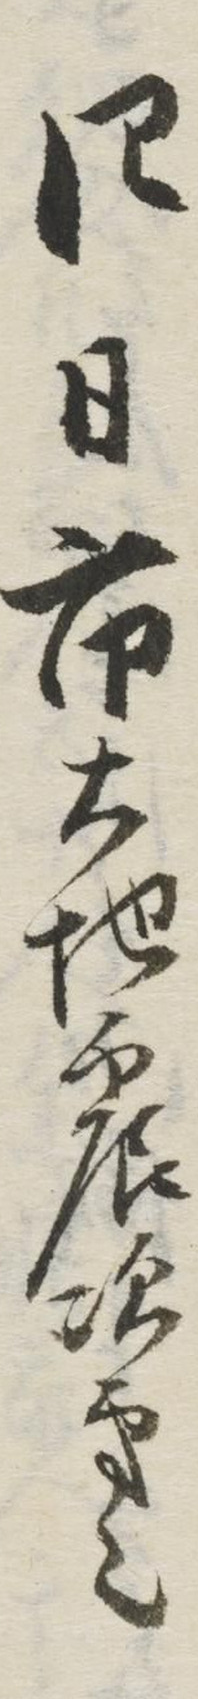四日市大地震次第也
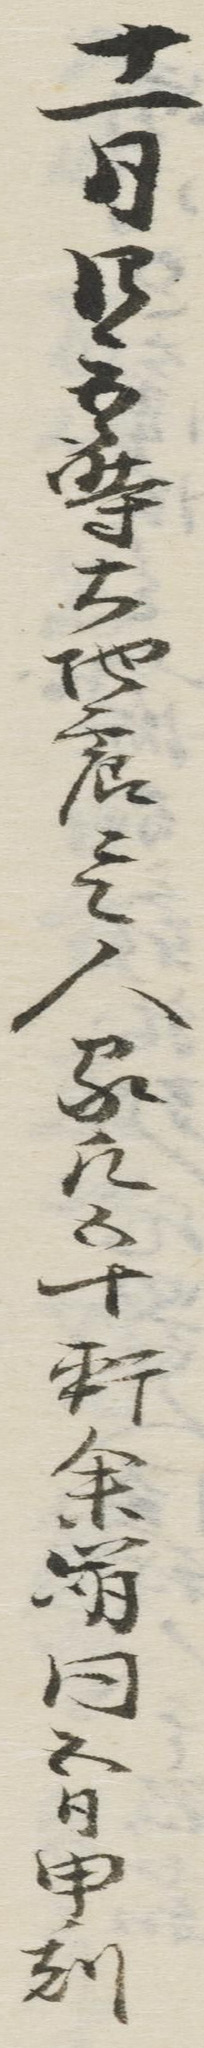十一月四日朝五ッ時大地震ニて人家凡五十軒余崩同五日申刻
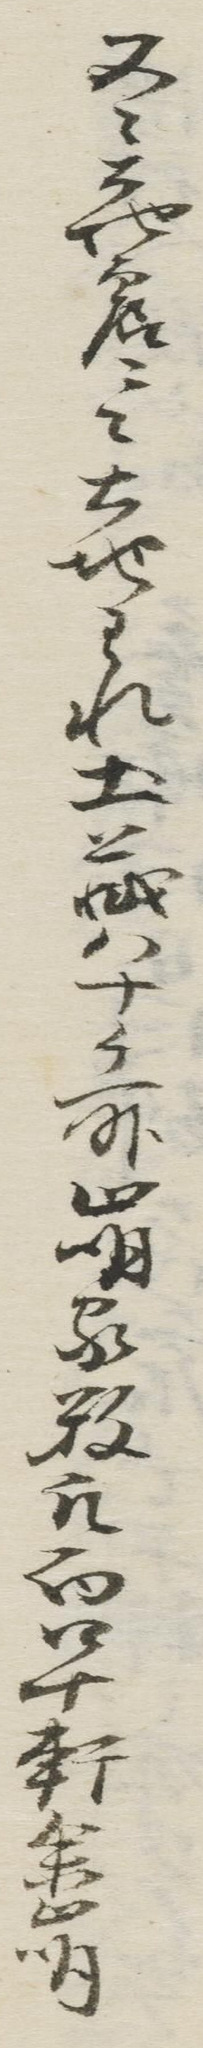又々大地震ニて大地われ土蔵八十ヶ所崩家数凡百四十軒余崩
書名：諸国大地震大津波一代記
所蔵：東京大学地震研究所図書室 Earthquake Research Institute Library, The University of Tokyo, JAPAN
